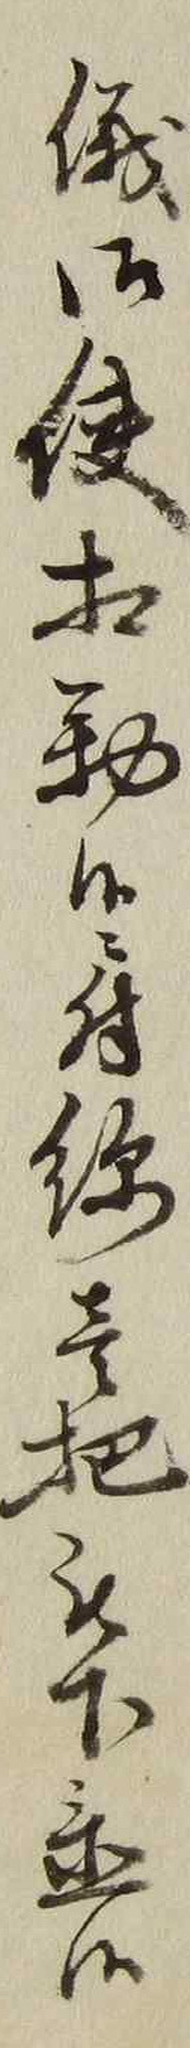儀御使相勤候ニ付綿壱把被下置候
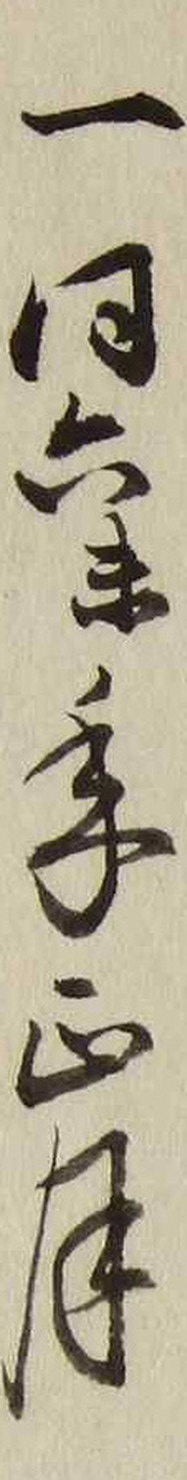一同六未年正月
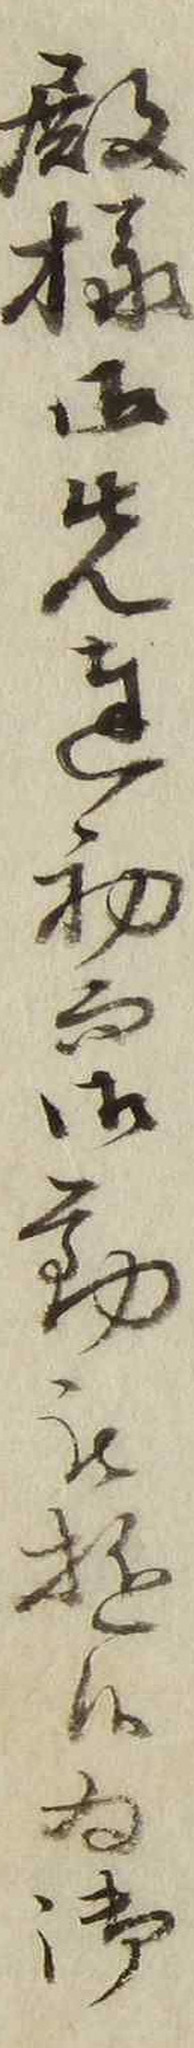殿様御先達初而御勤被遊候為御

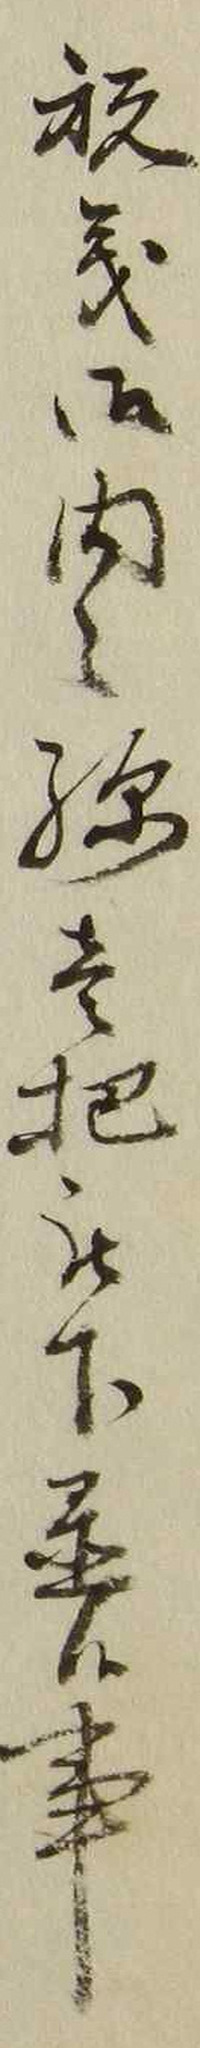祝義御内々綿壱把被下置候事
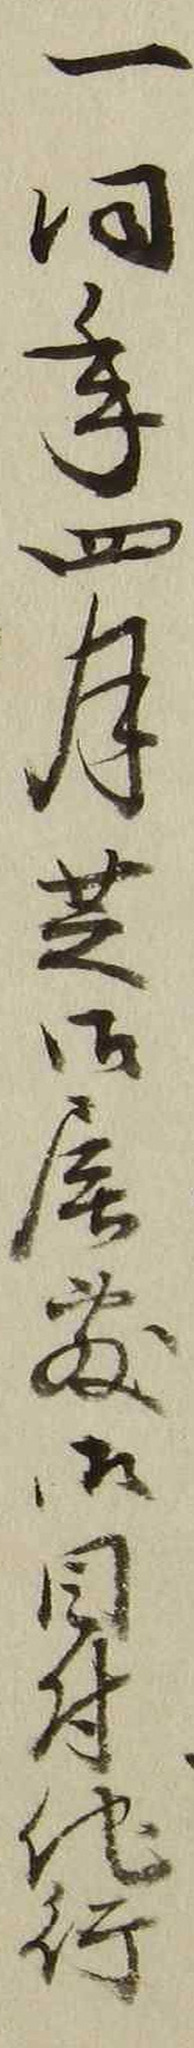一同年四月芝御屋敷御目付他行
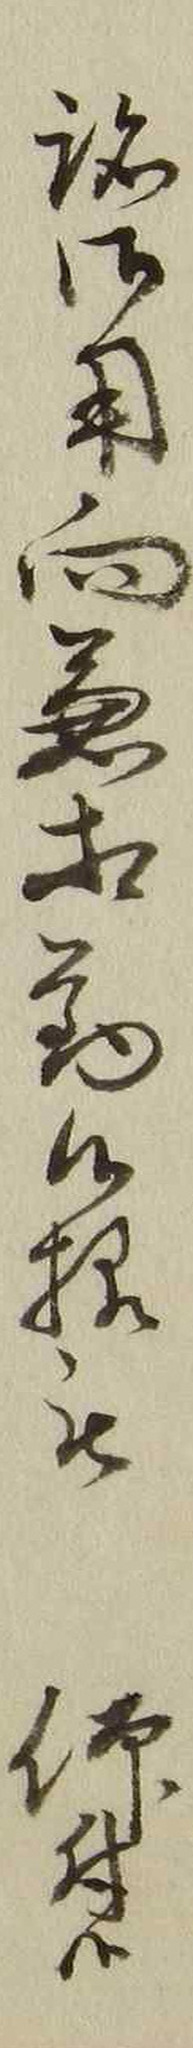跡御用向兼相勤候様被仰付候
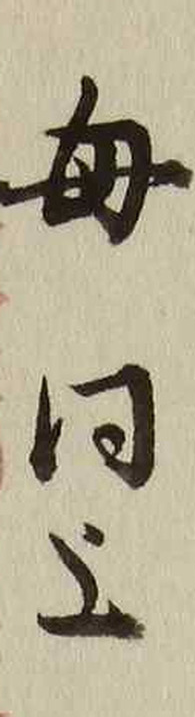母同上
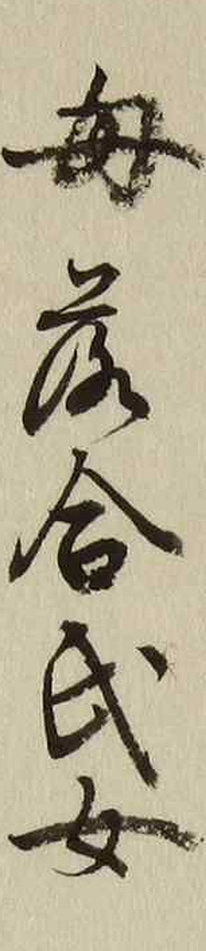母落合氏女
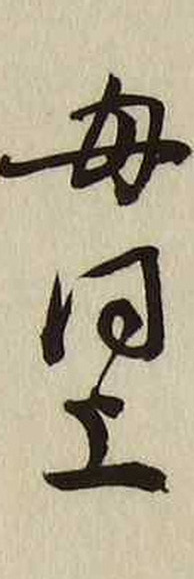母同上
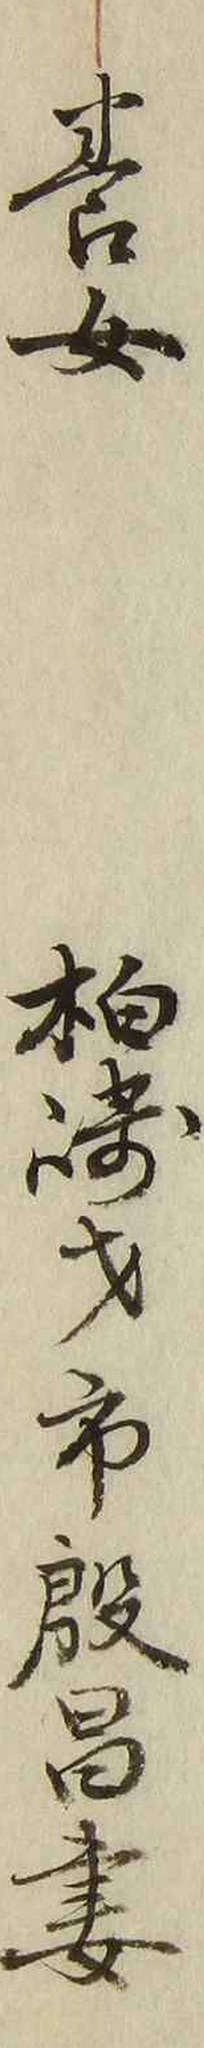養女柏崎才市殷昌妻

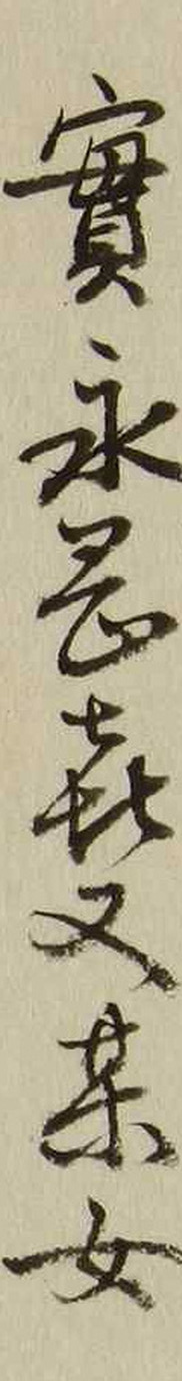実永岡喜又某女
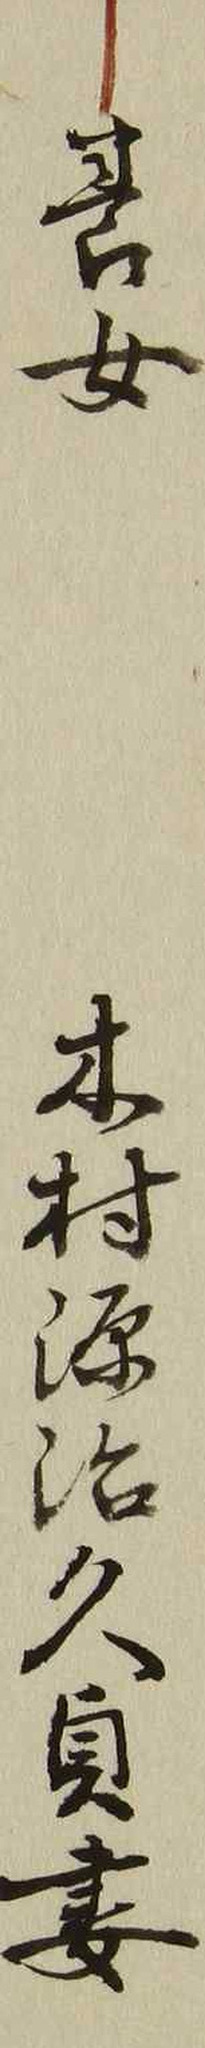養女木村源治久貞妻
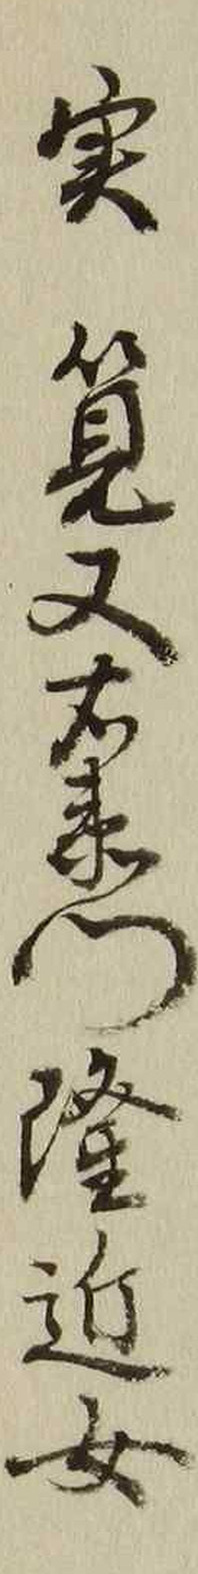実筧又右衛門隆近女
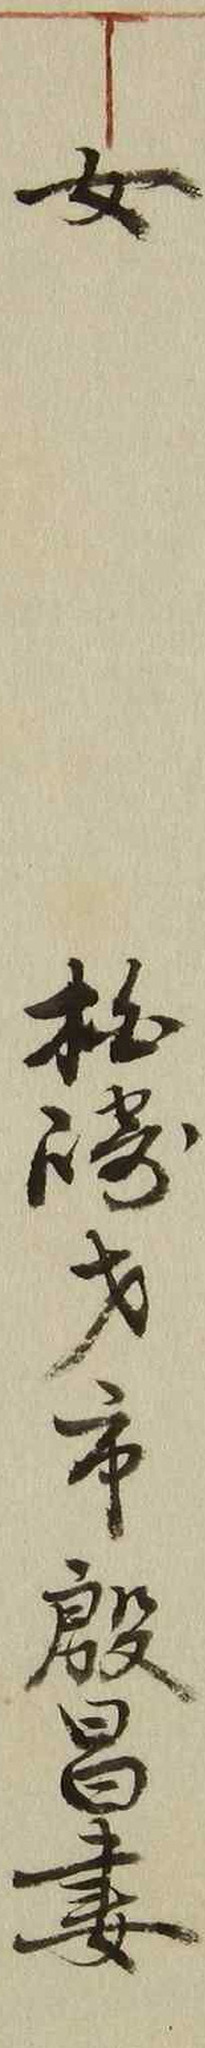女松崎才市殷昌妻
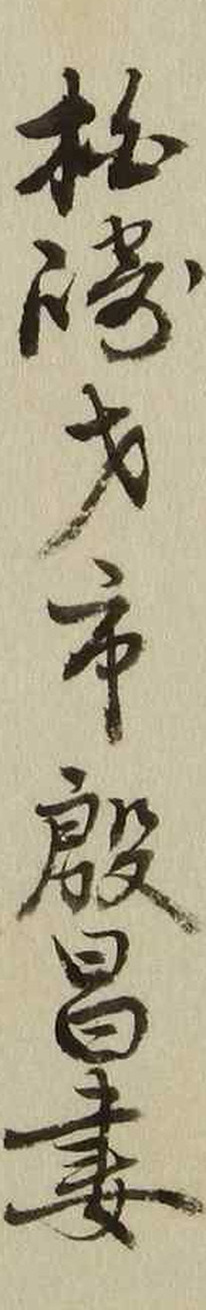女松崎才市殷昌妻
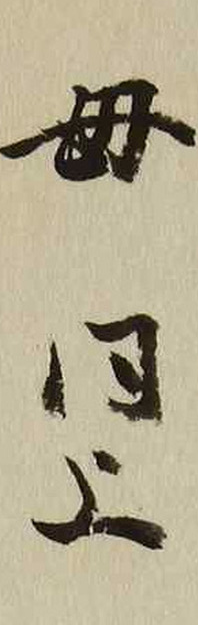母同上
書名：諸士系譜　巻之35　は之部3
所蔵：会津若松市立会津図書館
